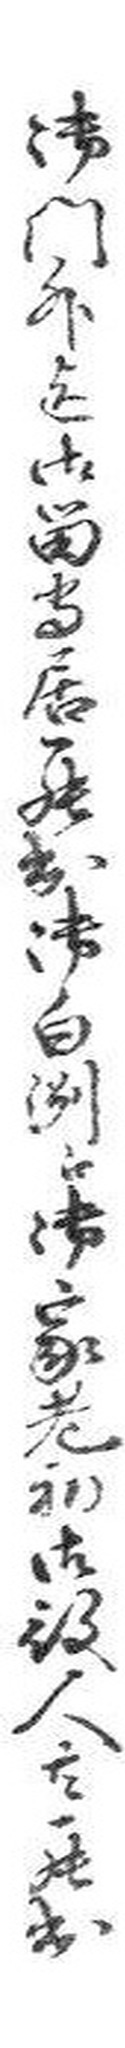御門外迄御留守居罷出御白洲江御家老初御役人共罷出
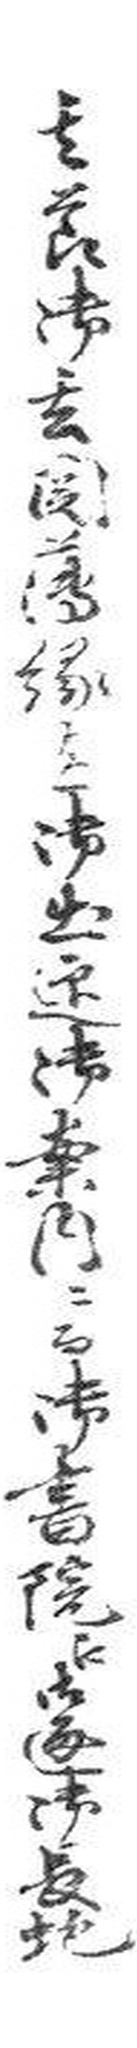其節御玄関薄縁迄御出迎御案内ニ而御書院江御通御長蚫
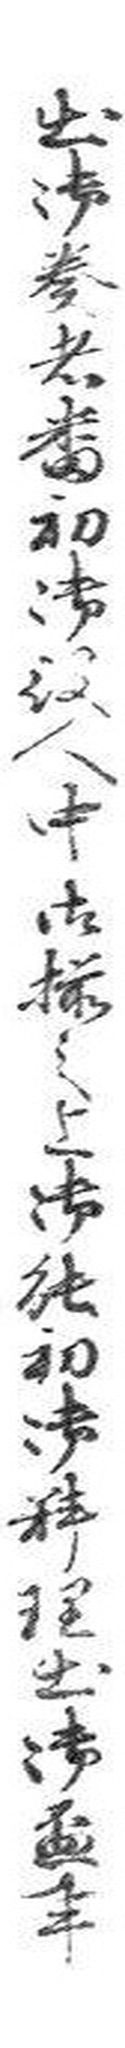出御奏者番初御役人中御揃之上御能初御料理出御盃事
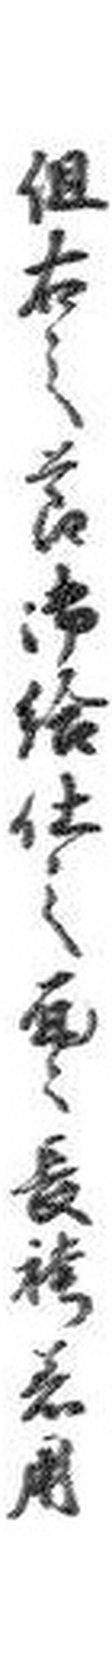但右之節御給仕之面々長袴着用
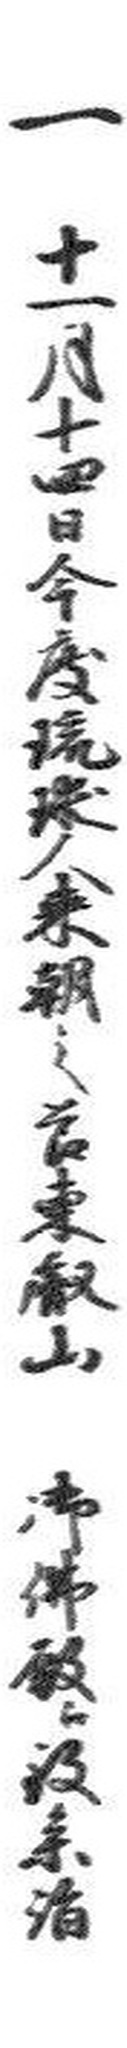一十一月十四日今度琉球人来朝之節東叡山御仏殿江致参詣
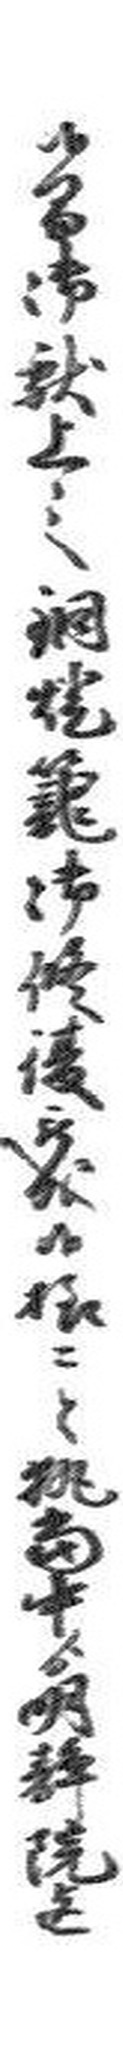候間御献上之銅灯篭御修復被成候様ニと執当中ゟ明静院迄
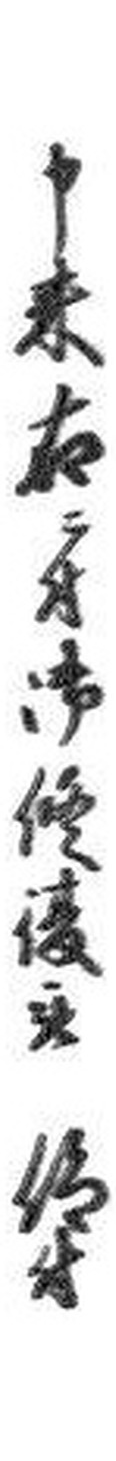申来右ニ付御修復被仰付
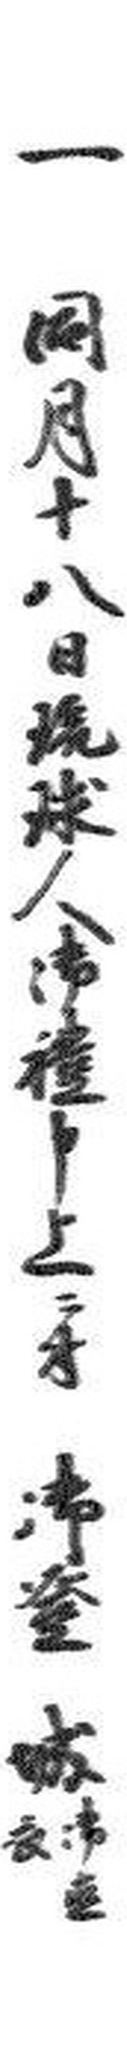一同月十八日琉球人御礼申上ニ付御登城御直衣
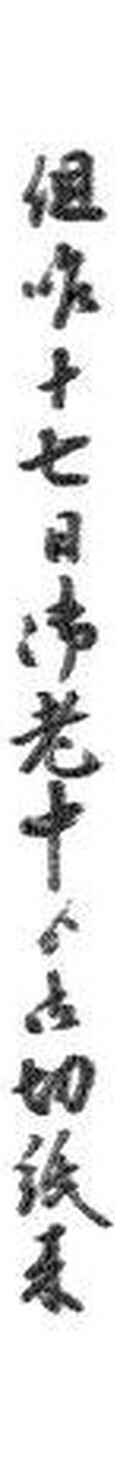但昨十七日御老中ゟ御切紙来
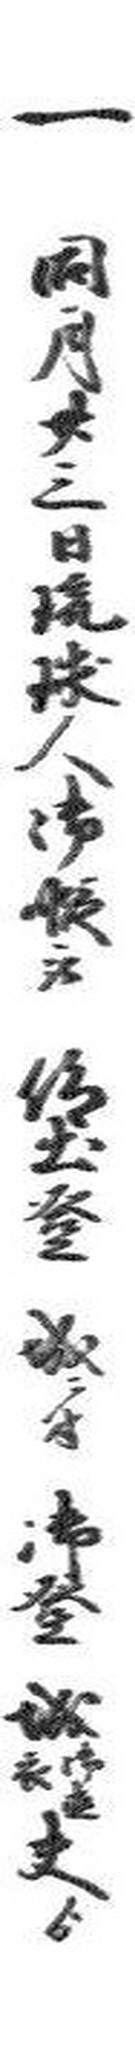一同月廿三日琉球人御暇被仰出登城ニ付御登城御直衣夫ゟ
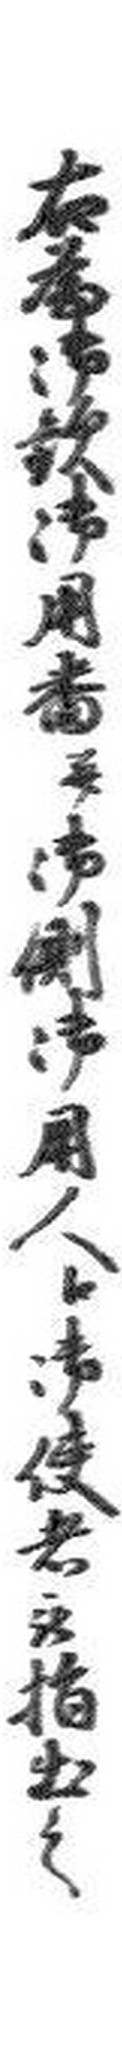右為御歓御用番并御側御用人江御使者被指出之
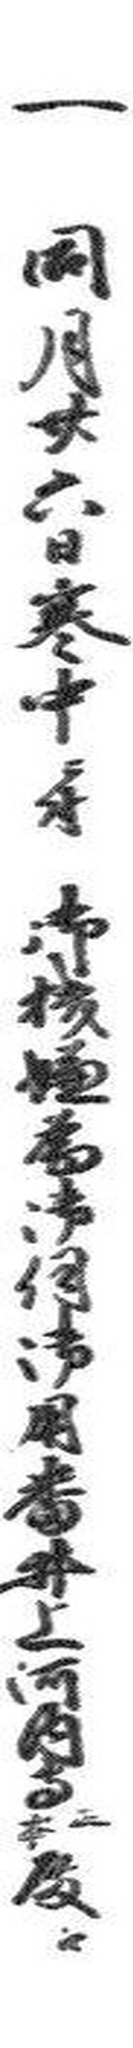一同月廿六日寒中ニ付御機嫌為御伺御用番井上河内守正岑殿江

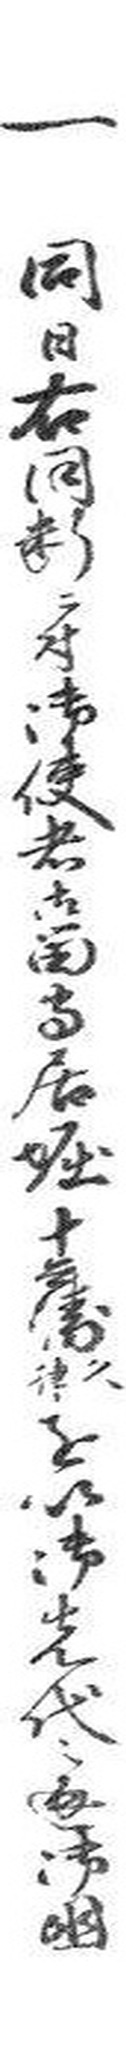一同日右同断ニ付御使者御留守居堀十兵衛久律を以御先代之通御国
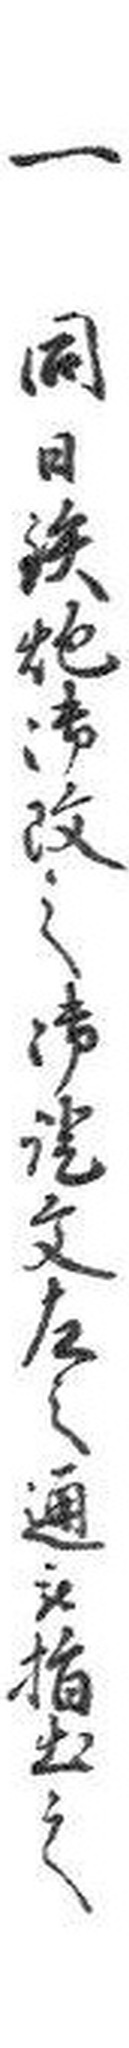一同日鉄砲御改之御証文左之通被指出之
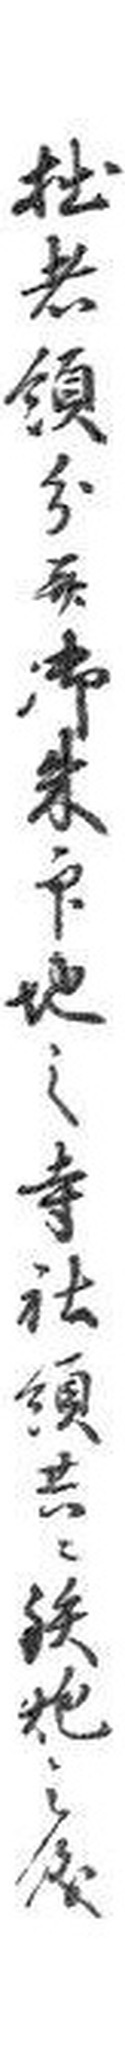拙者領分并御朱印地之寺社領共ニ鉄砲之儀
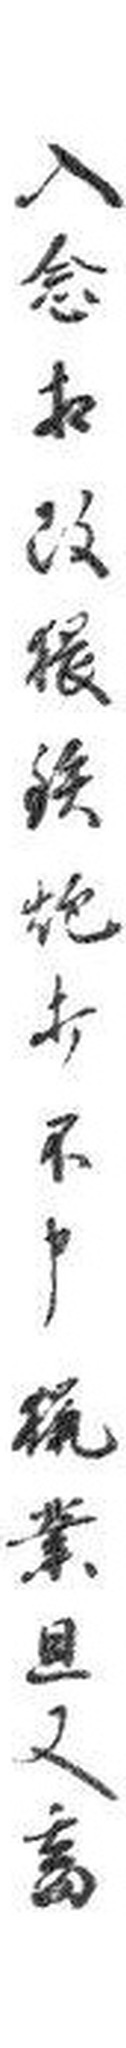入念相改猥鉄砲打不申猟業且又畜
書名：家譜 二十八 吉邦公 従宝永七年七月五日到正徳元年十二月
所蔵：福井県文書館 Fukui Prefectural Archives
